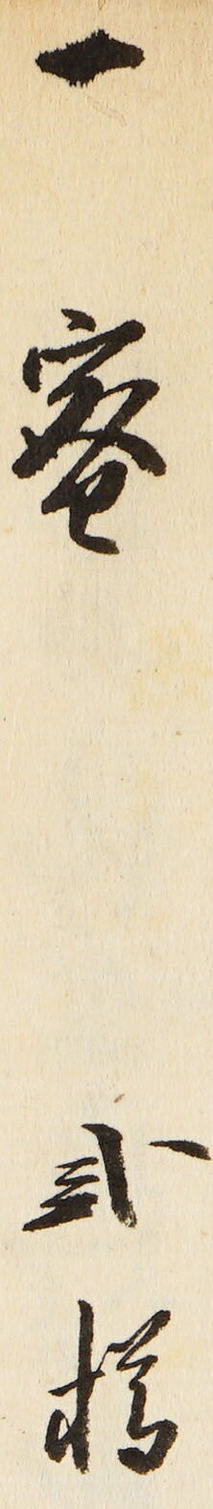一蜜弐樽
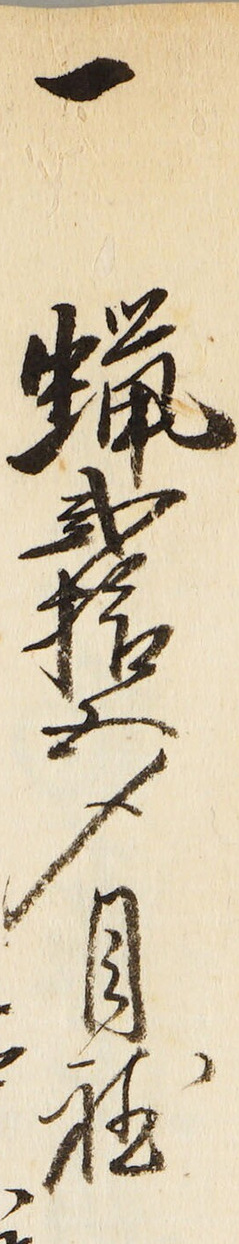一蝋弐拾五貫目程
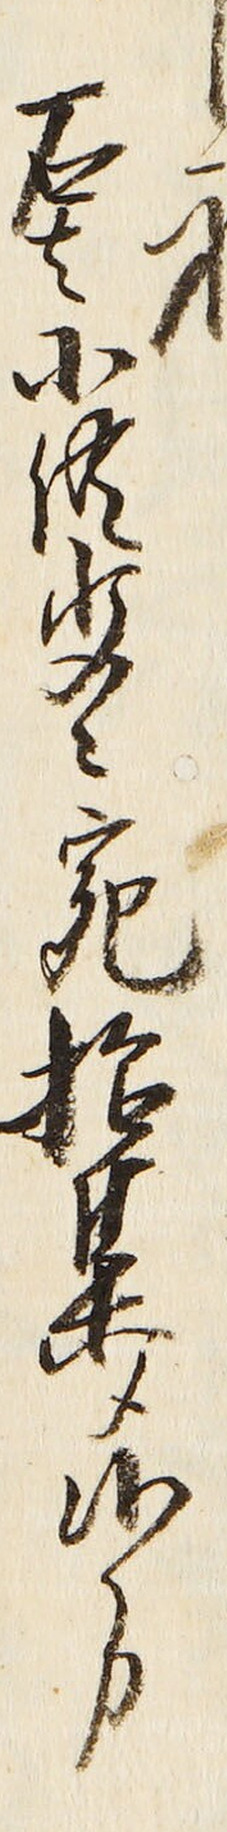右者小供少々宛拾集メ候方
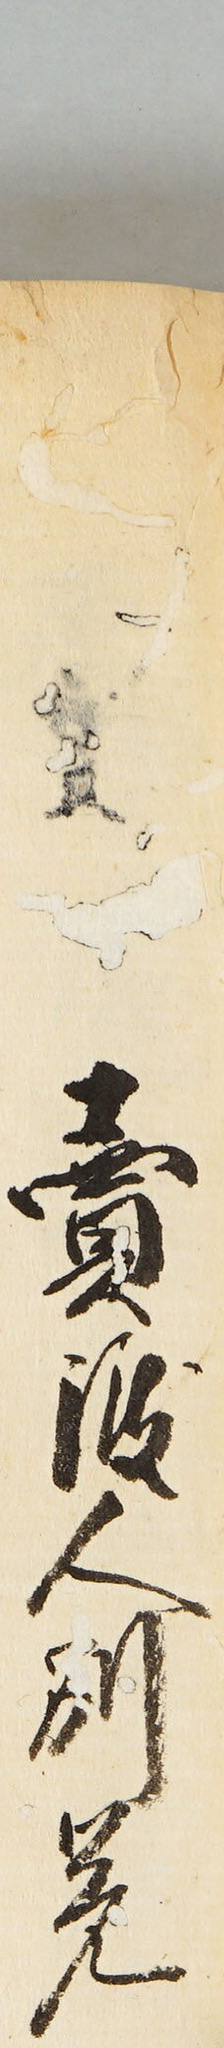売渡人別覚
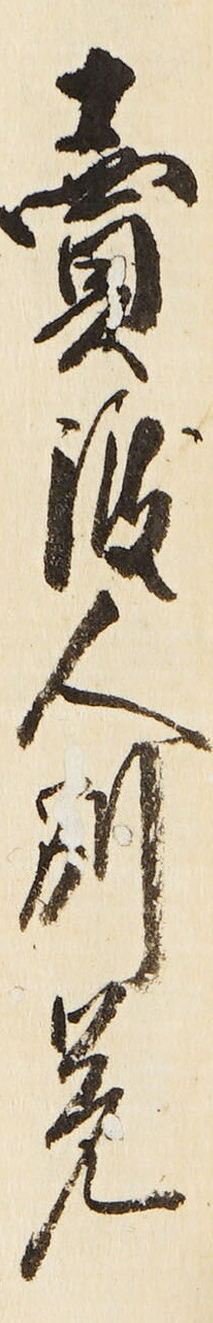売渡人別覚
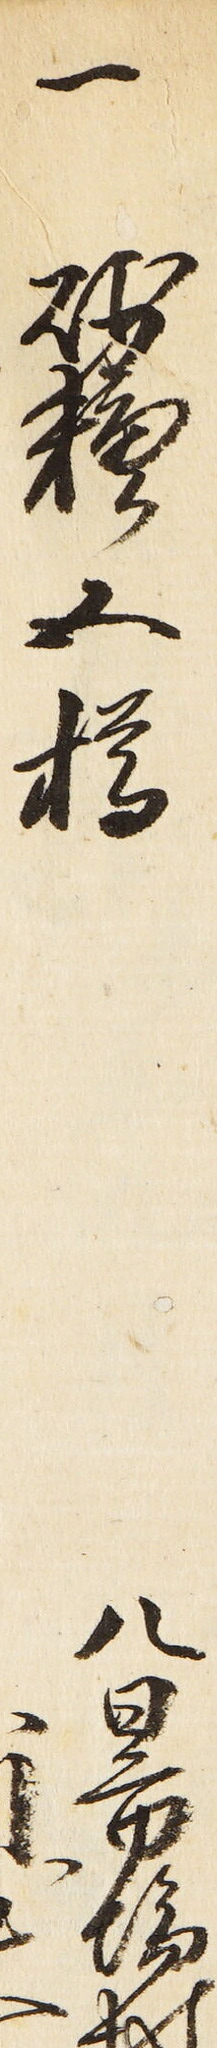一砂糖五樽八日市場村
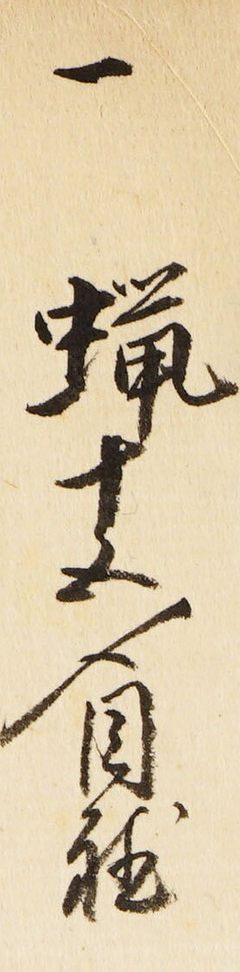一蝋弐拾五貫目程
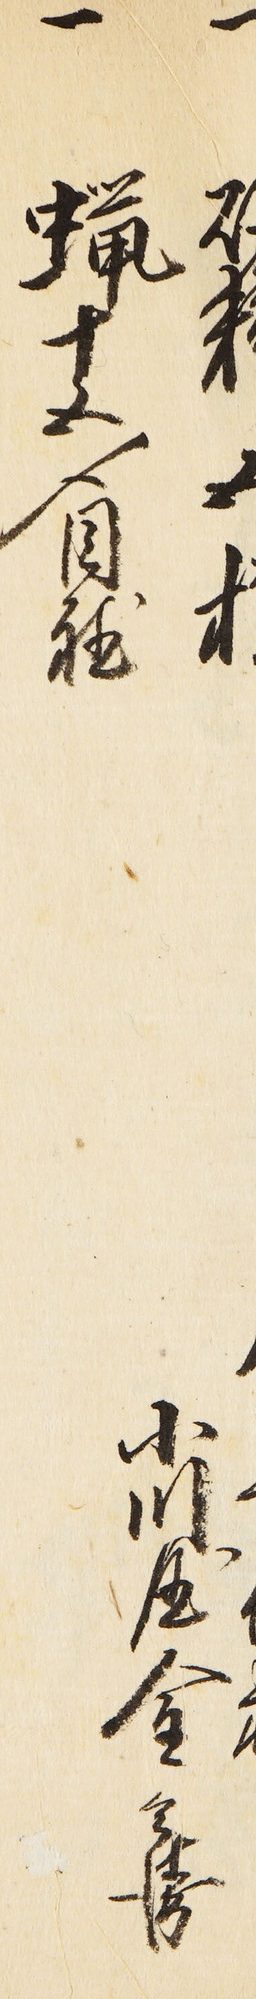一蝋十五貫目程小川屋金兵衛

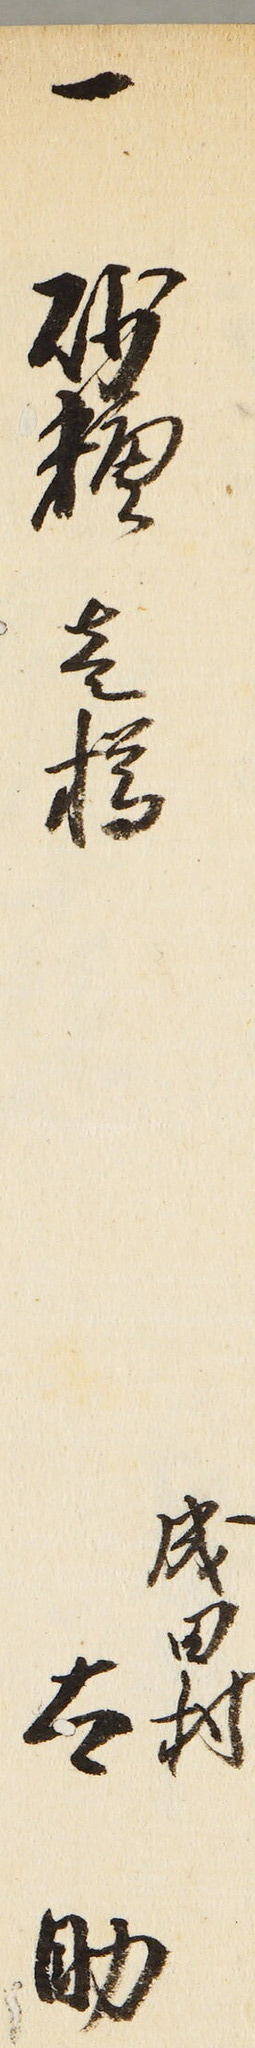一砂糖壱樽成田村
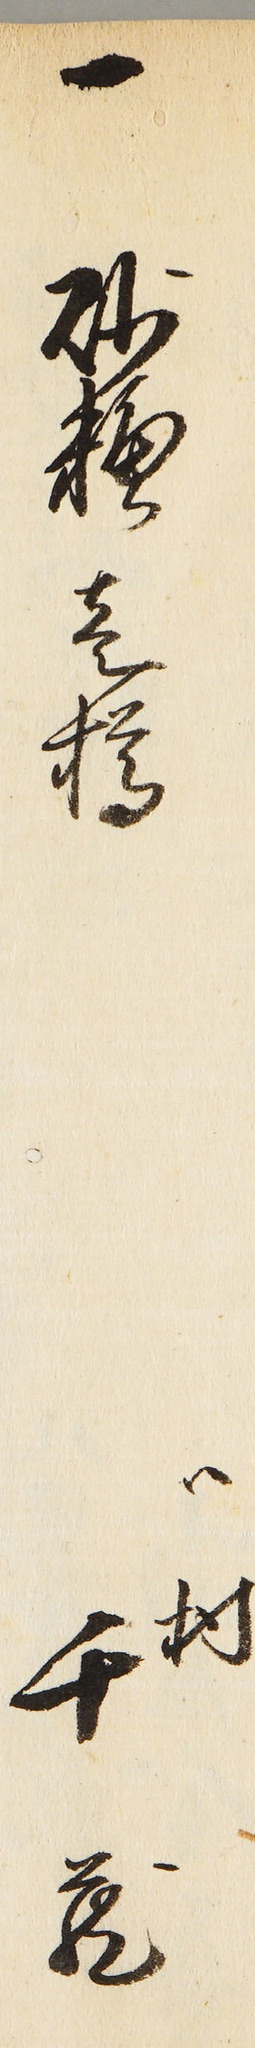一砂糖壱樽同村
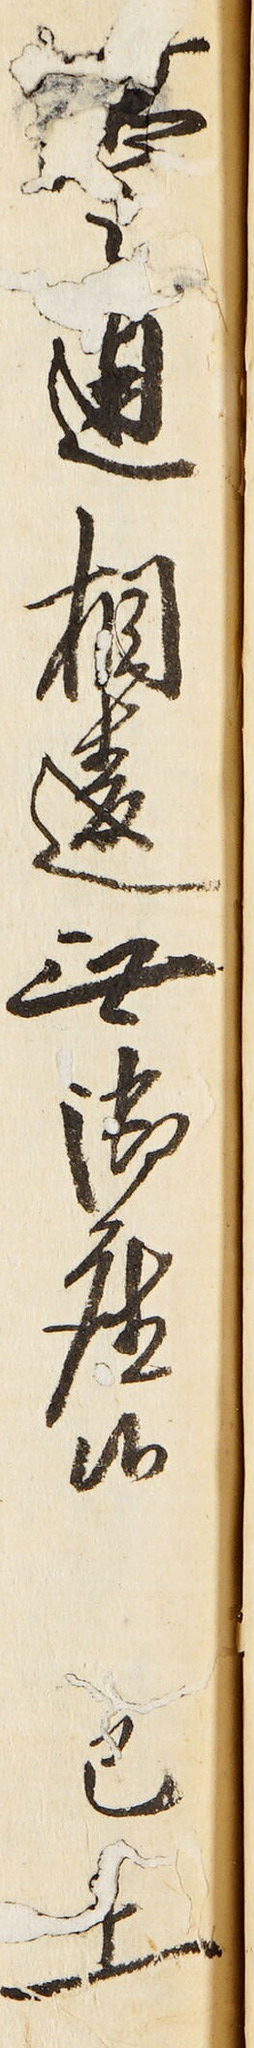右之通相違無御座候已上
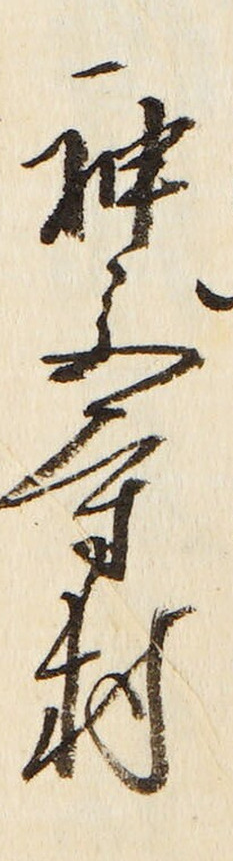神宮寺村
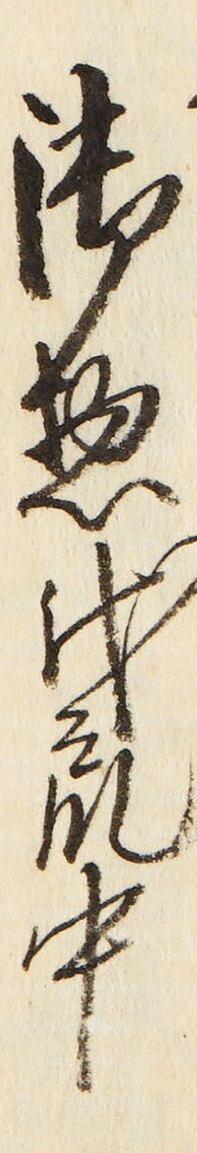御惣代衆中

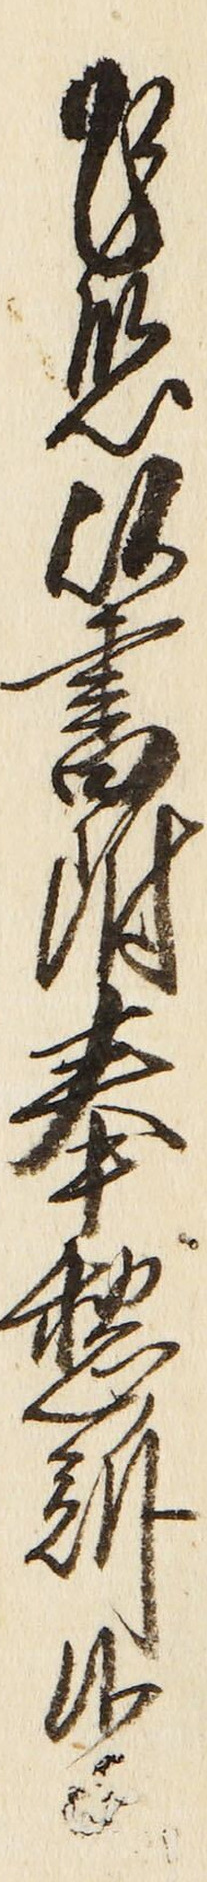乍恐以書付奉愁訴候
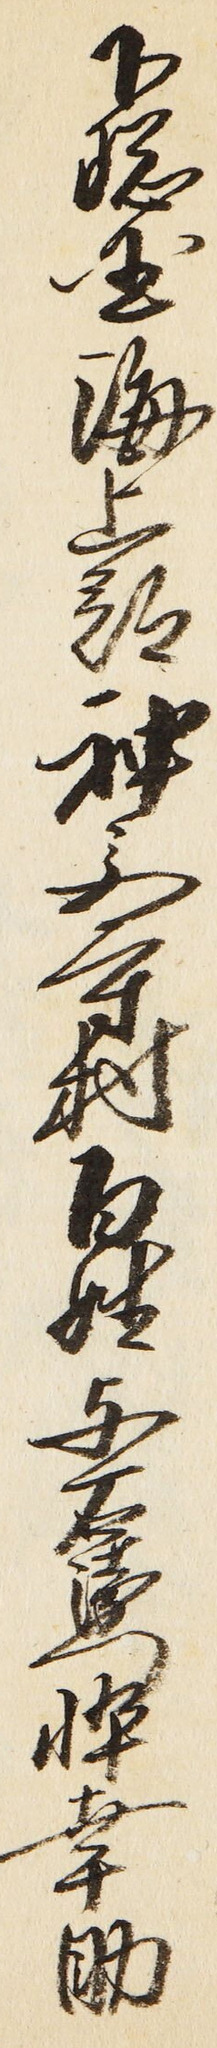一下総国海上郡神宮寺村百姓与右衛門忰幸助
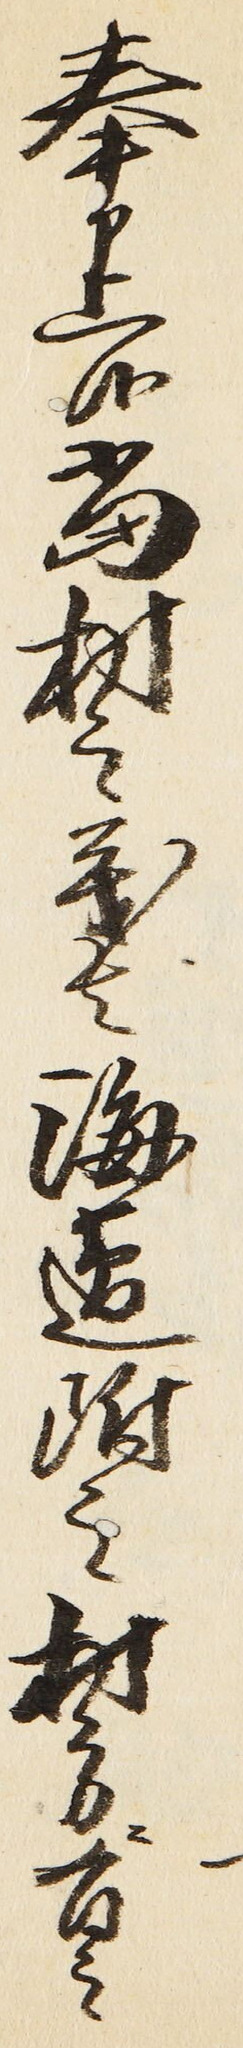奉申上候当村之義者海辺付之村方ニ有之
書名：難船一件記録
